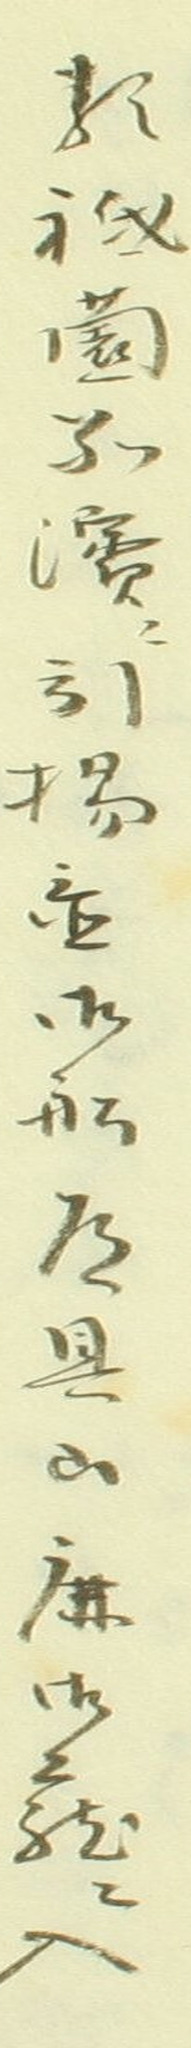類祇？？浜に引揚置御船道具山廉御蔵に入
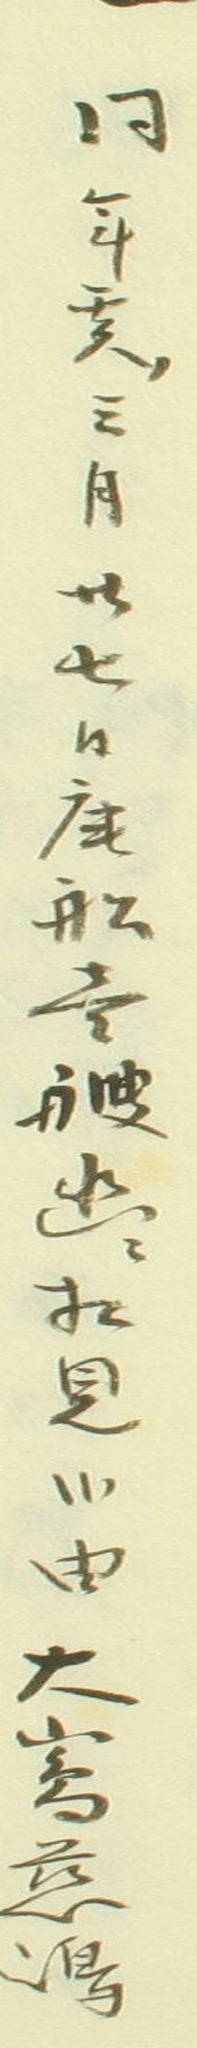一同年亥の三月廿七日唐船壱艘迚に相見候由大嶋慈嶋
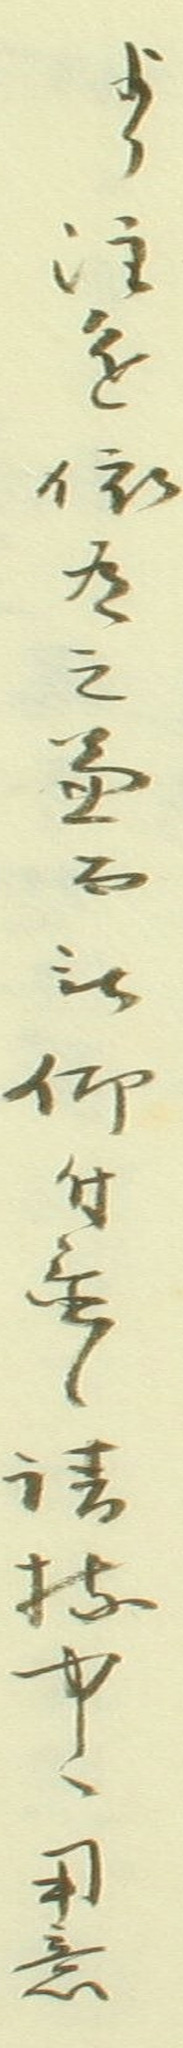より注進依有之兼而被仰付置候請持申候用意
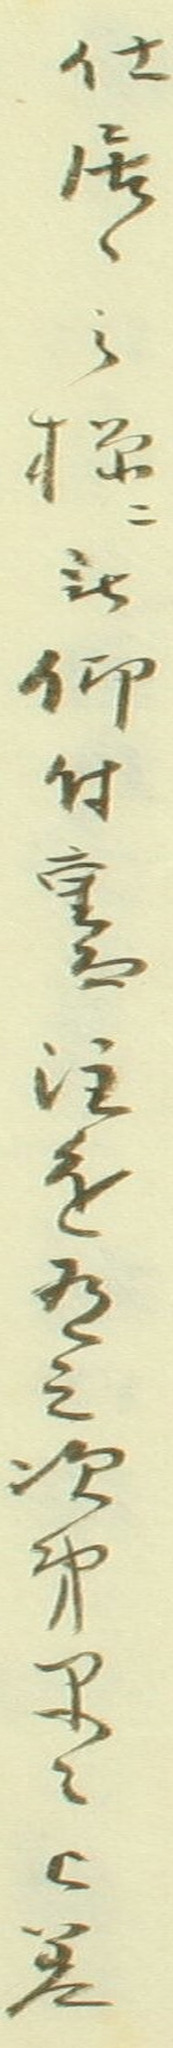仕居候之様に被仰付重而注進有之次第早々被差
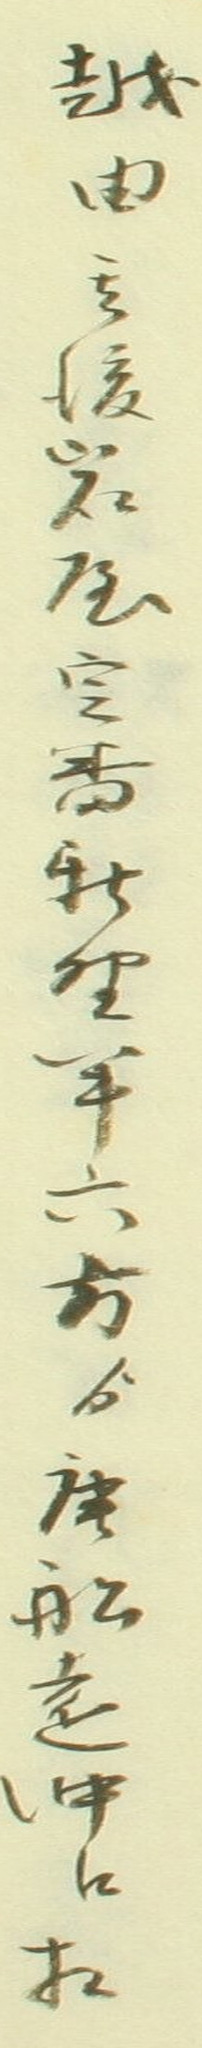越由其後岩屋完番新野半六方ゟ唐船遠沖江相
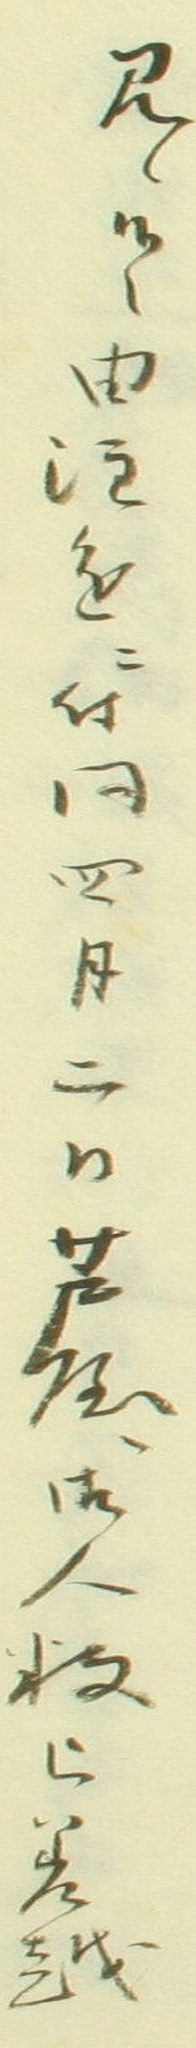見候様之由注進に付同四月二日芦屋へ御人数差越
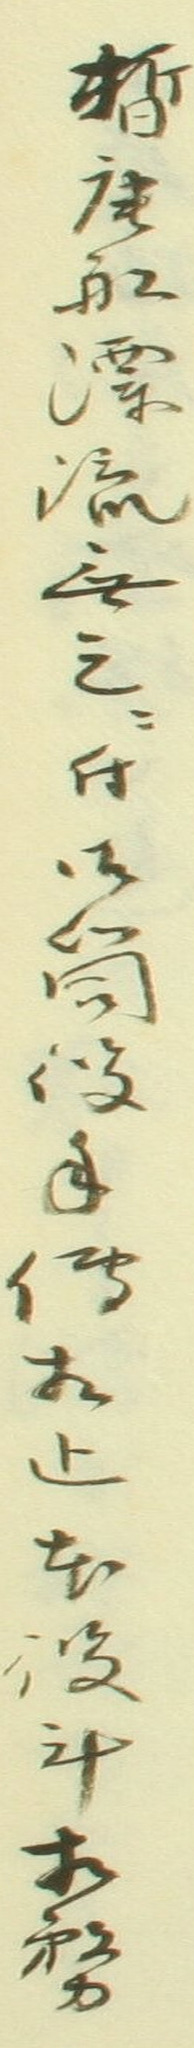暫唐船漂流無之に付御筒役手伝相止本役斗相務

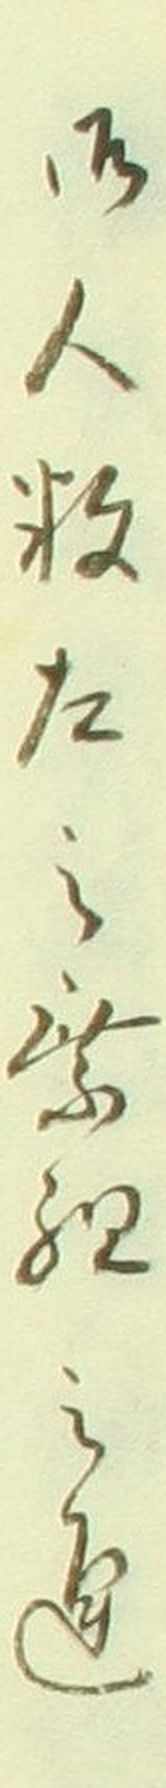御人数左之乗組の通
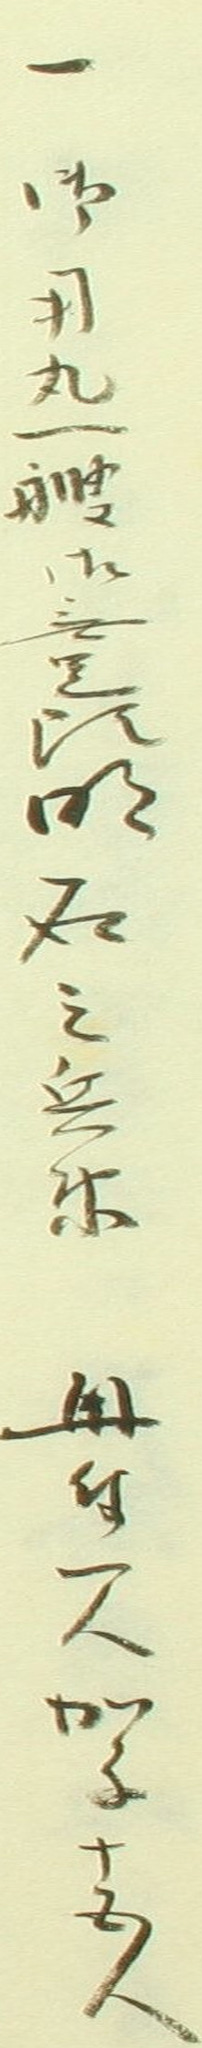一御用丸一艘御無足頭明石之兵衛舟付一人加子十五人
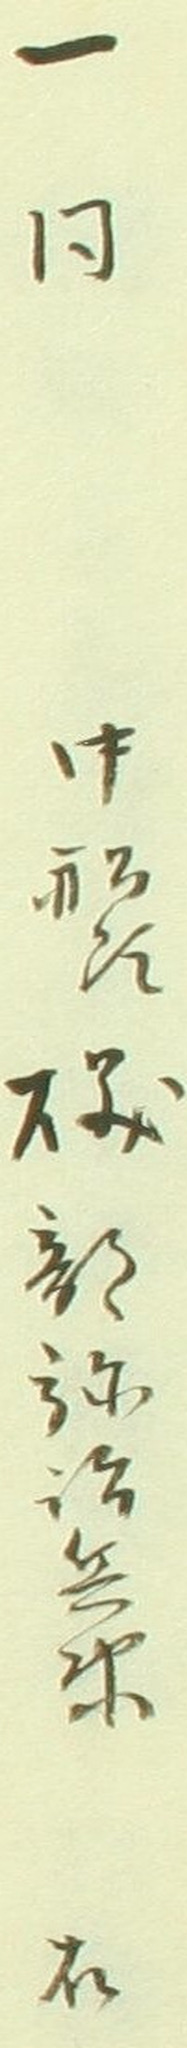一同中船頭？顔弥治兵衛右同断
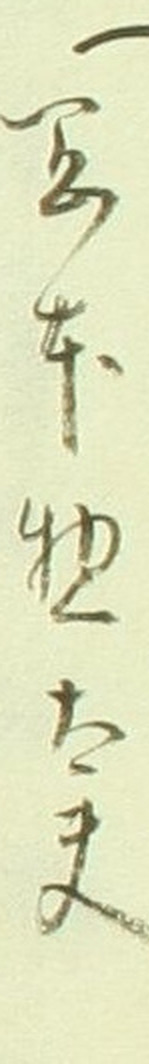岡本惣太夫
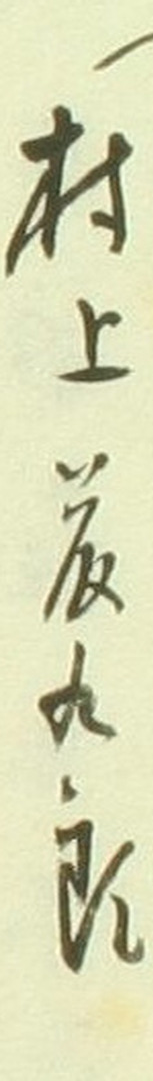村上籐九郎
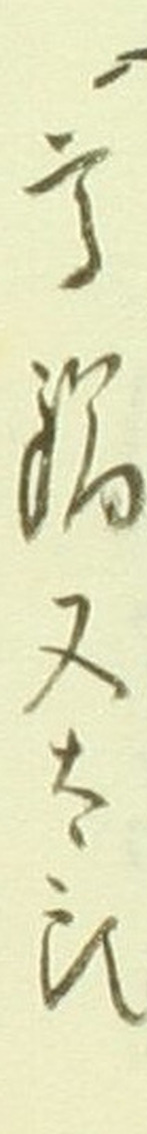高島又太郎
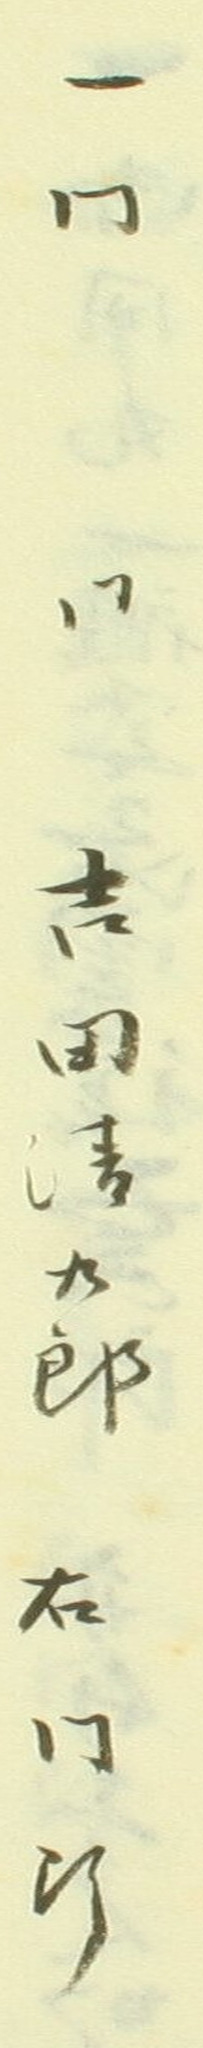一同同吉田清太郎右同断
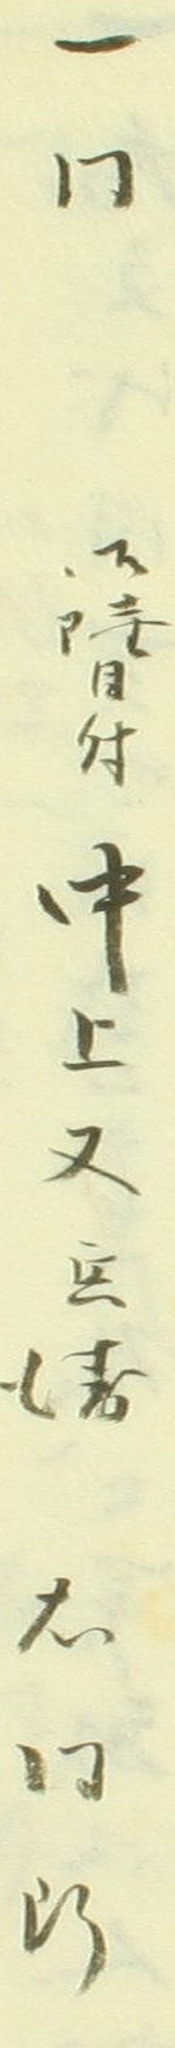一同御陸目付中上又兵衛右同断
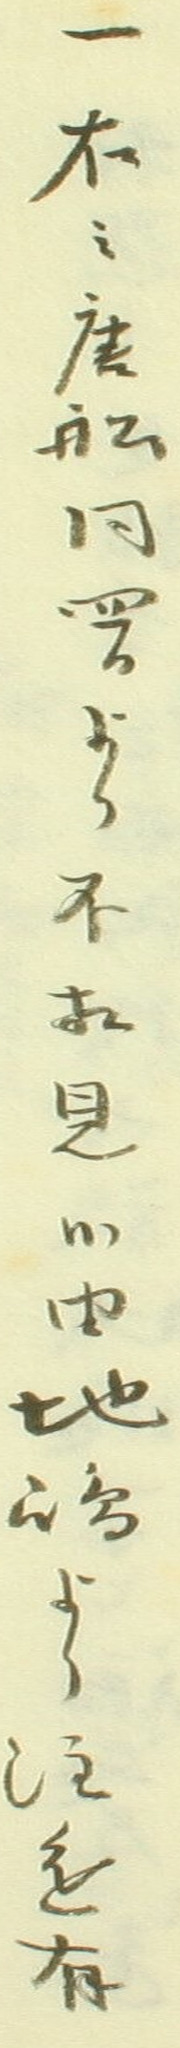一右之唐船同四日より不相見候由地嶋より注進有
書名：唐船漂流記 三
